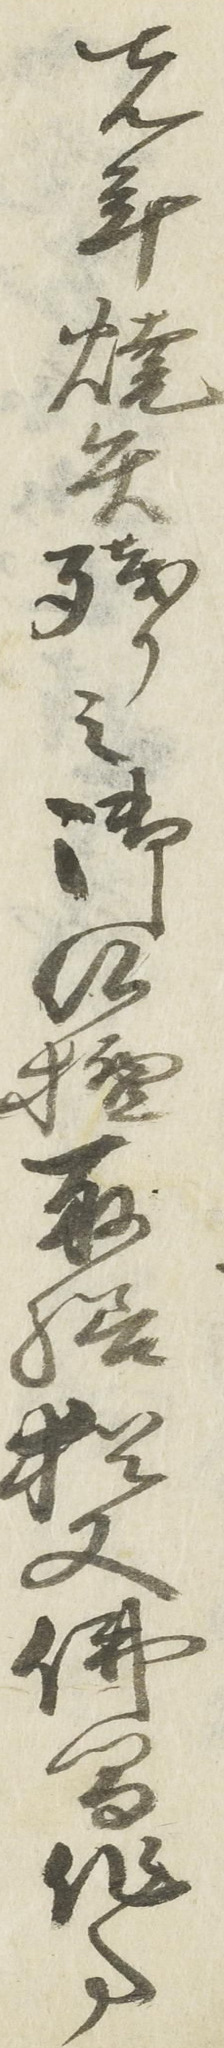先年焼失残り之御仏壇取繕猶又仏間作事
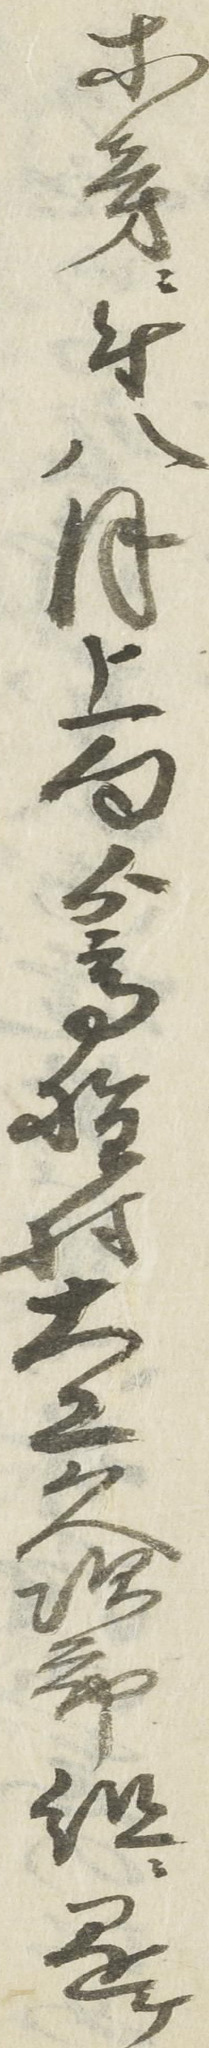等旁ニ付八月上旬ゟ高野村大工久次郎組ニ懸ケ
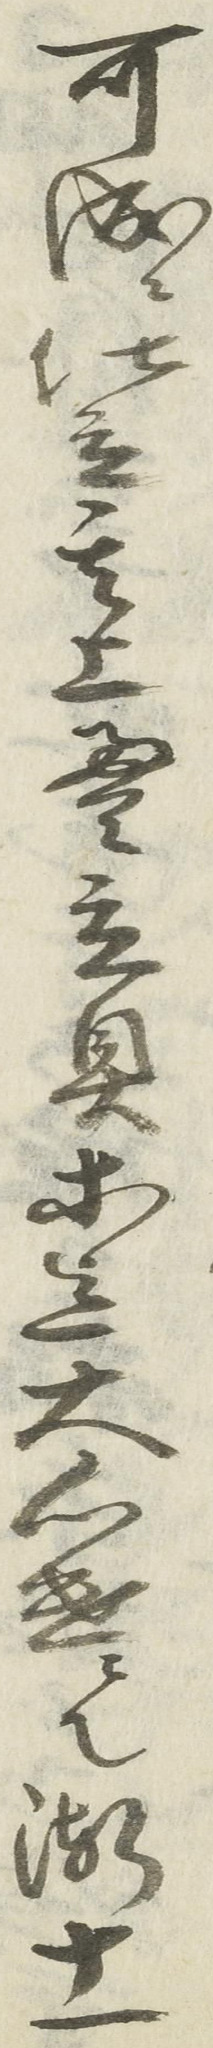可成ニ仕立其上畳立具等迄大心遣ニて漸十一
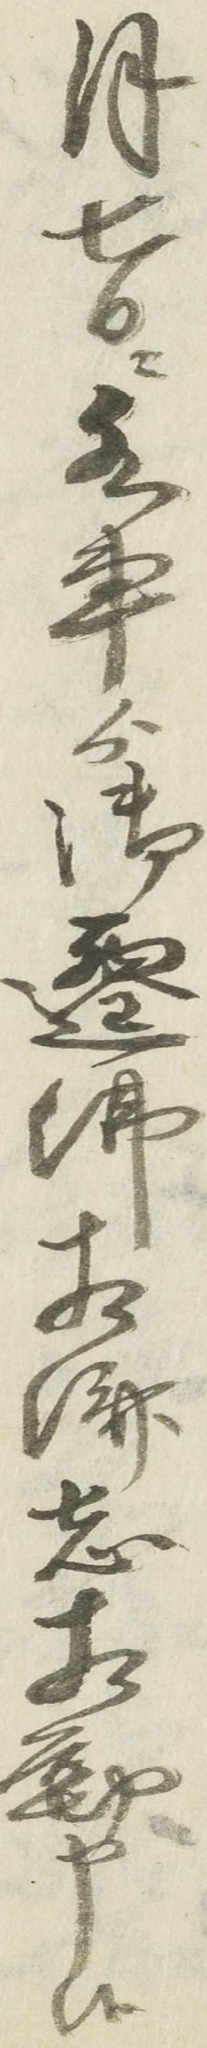月七日ニ水車ゟ御遷仏相済志相勤申候
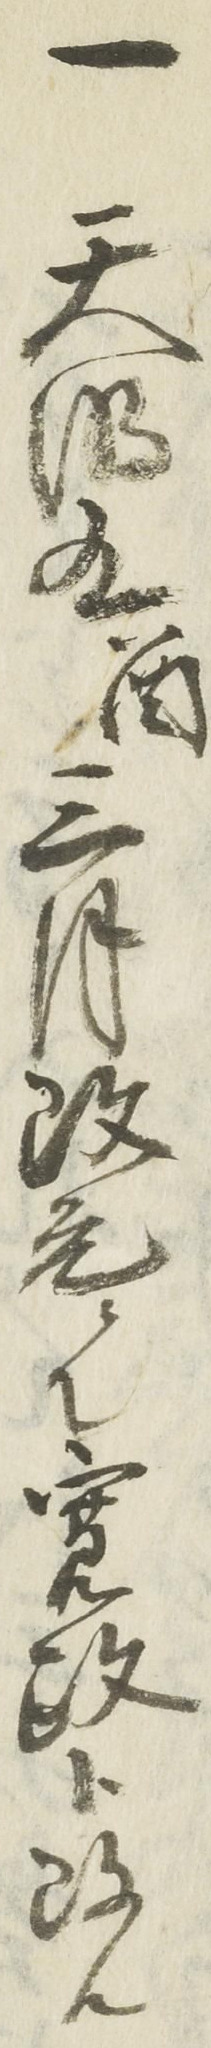一天明九酉三月改元ニて寛政ト改ル
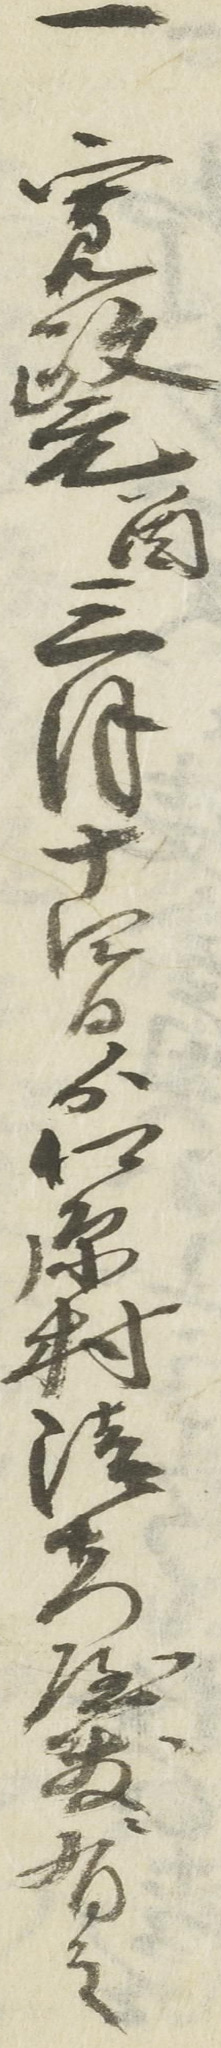一寛政元酉三月十四日ゟ郷原村清右衛門屋敷ニ有之
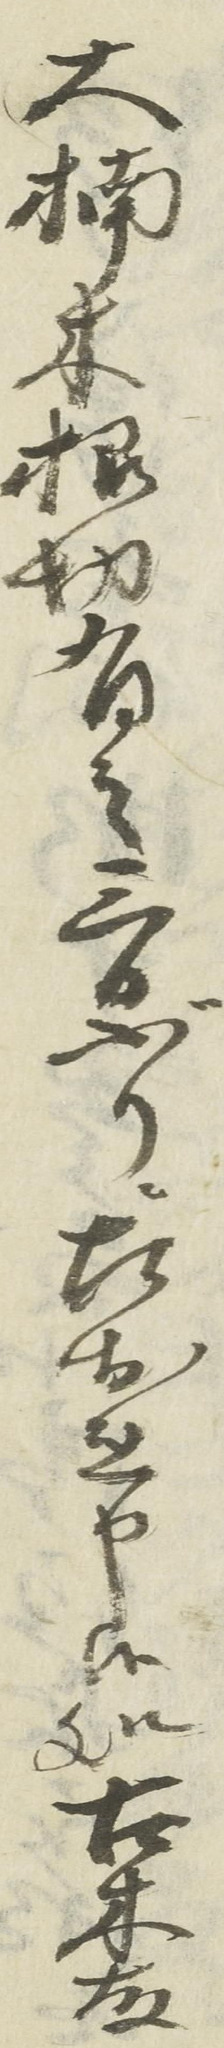大楠木根切有之三日ぶりニたおれ申候処古木故
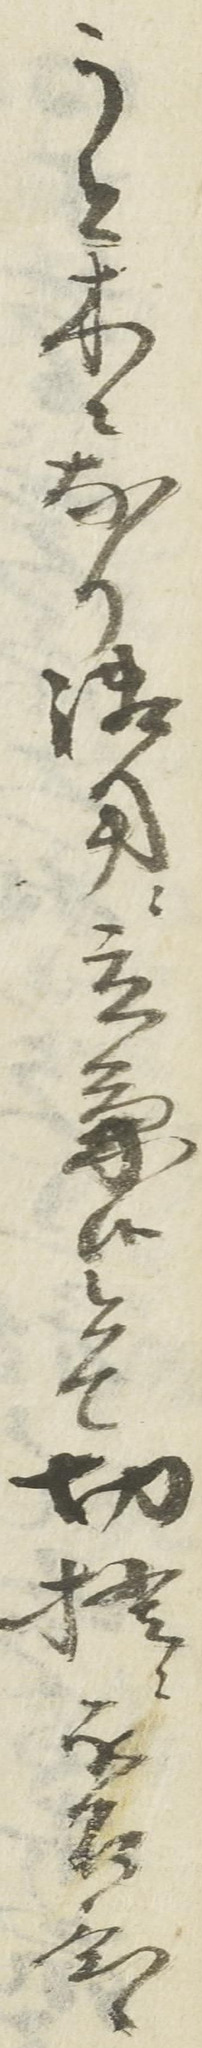うと木ニなり御用ニ立兼候とて切捨被召置候
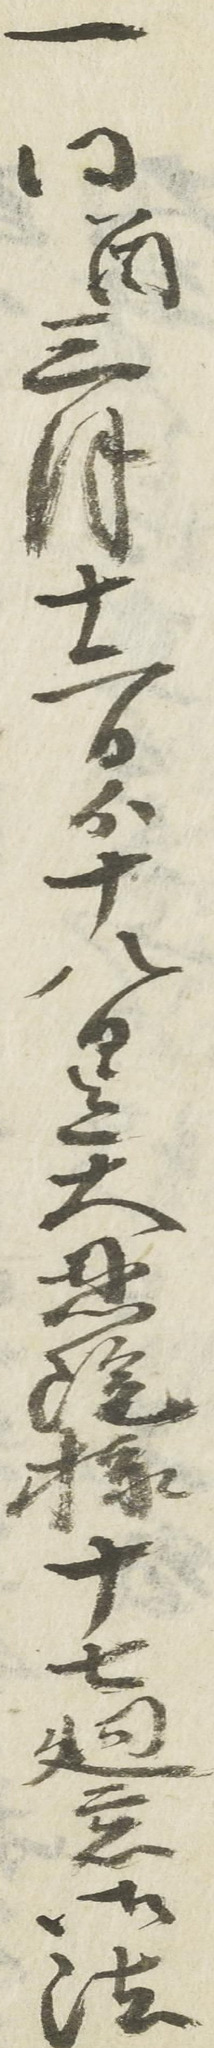一同酉三月十二日ゟ十八日迄大悲院様十七廻忘御法
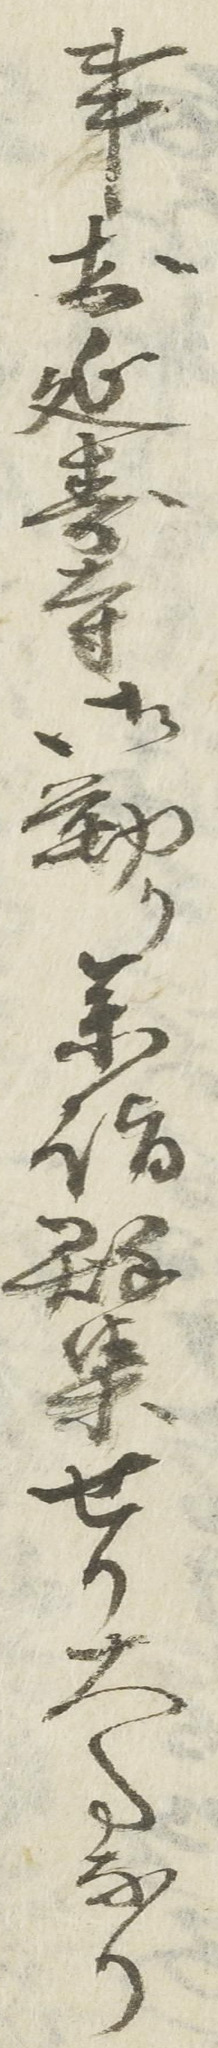事於延寿寺御勤り参詣群衆せり大事なり
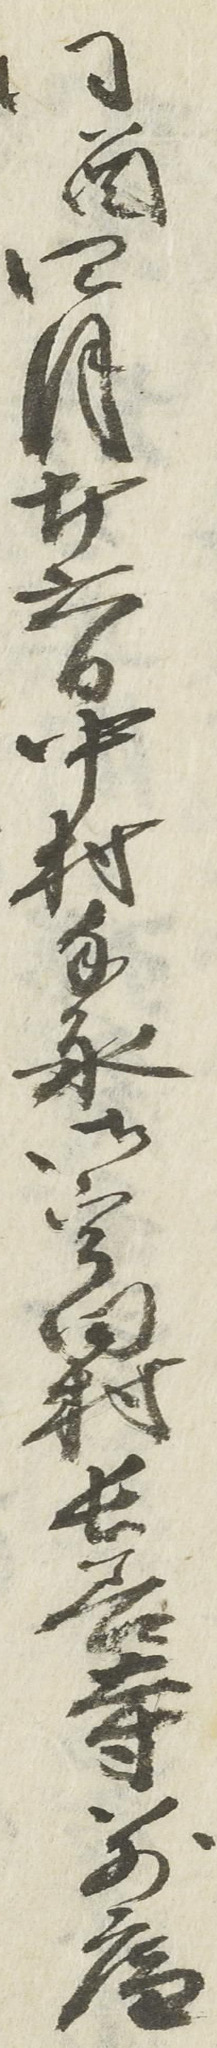一同酉四月廿六日中村手永御宇田村長善寺前廣
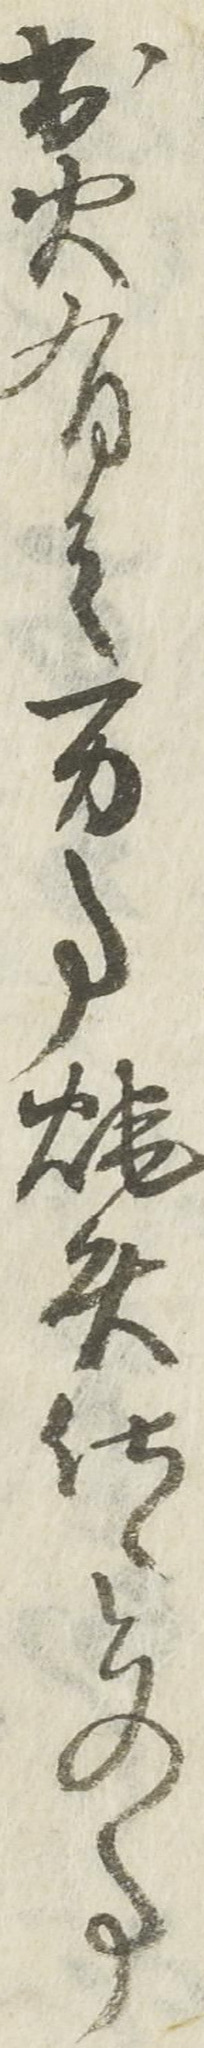出火有之万事焼失仕候との事
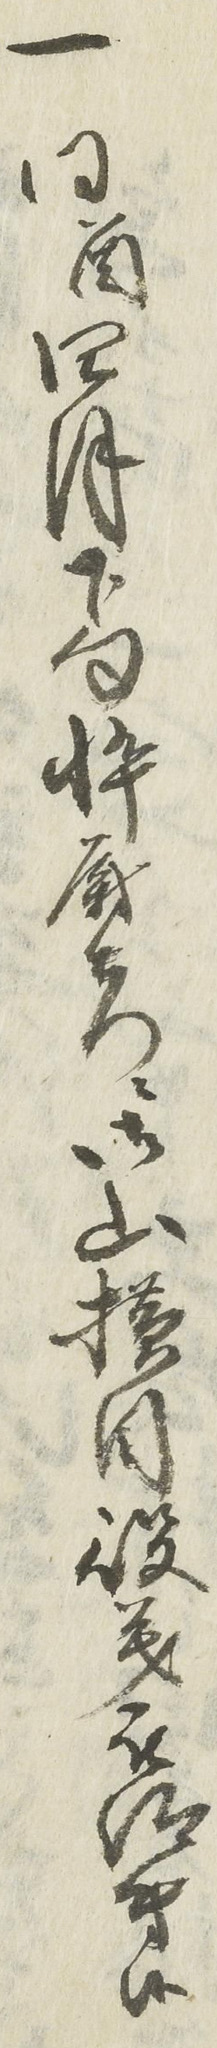一同酉四月下旬忰厨右衛門ニ御山横目役義被仰付候
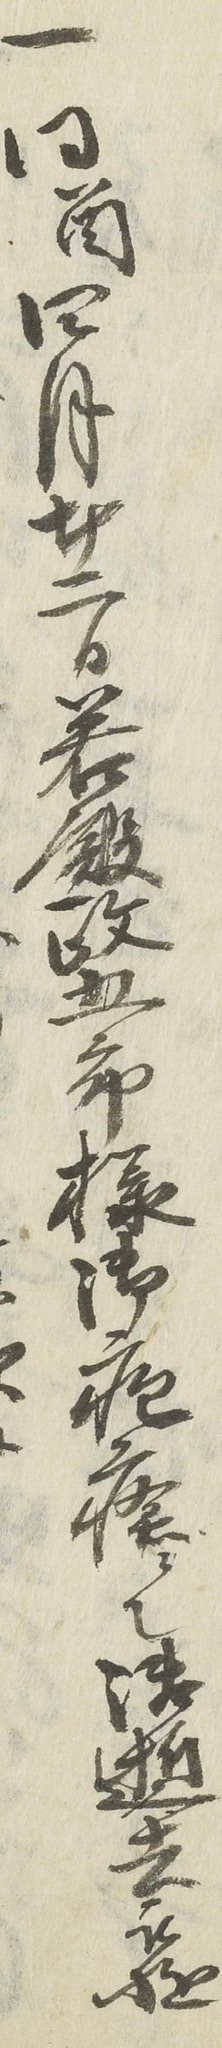一同酉四月廿二日若殿政五郎様御疱瘡ニて御逝去被遊
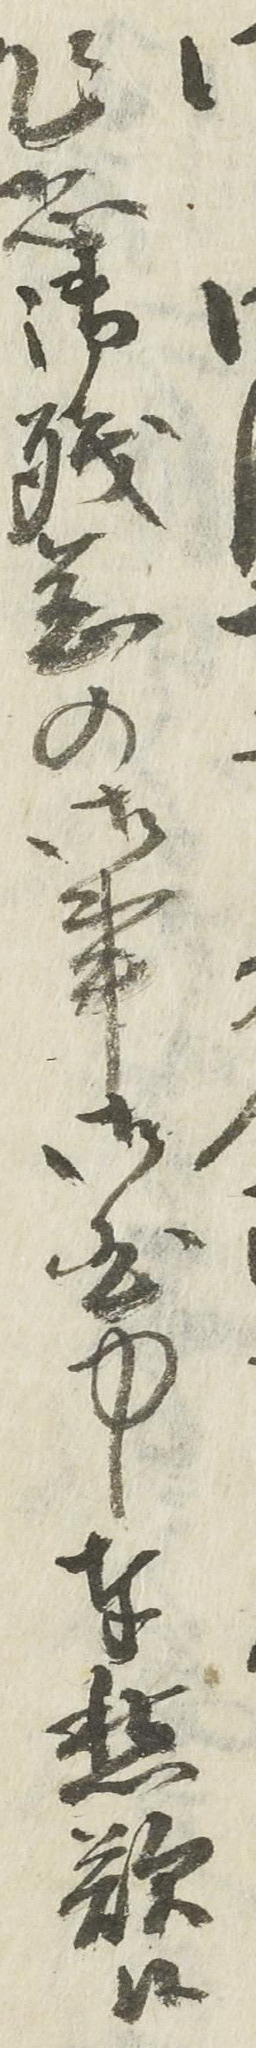乍恐御残念の御事御国中奉愁嘆候
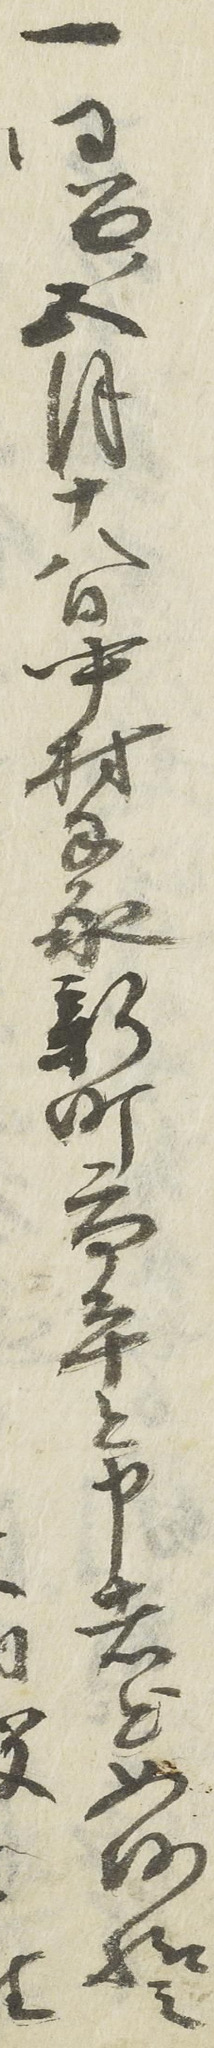一同酉ノ五月十八日中村手永新町市平と申者を如何様之
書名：後見笑
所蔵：東京大学地震研究所図書室 Earthquake Research Institute Library, The University of Tokyo, JAPAN
